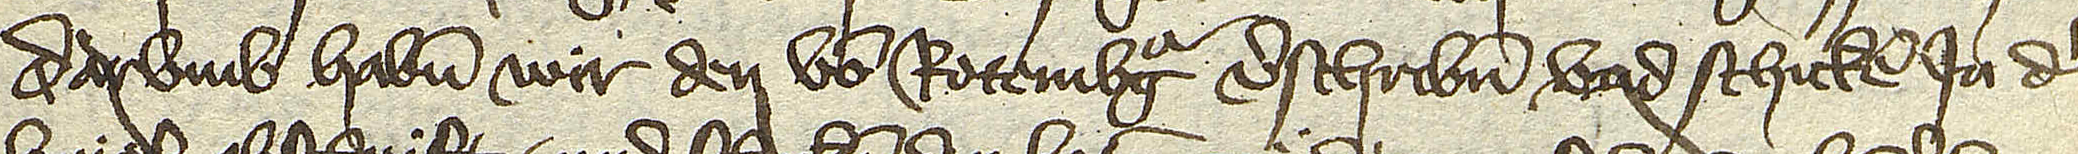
Darvmb habn* wir den vo* Rotemb*g v*ſchribn* / vnd ſchicke* In d*
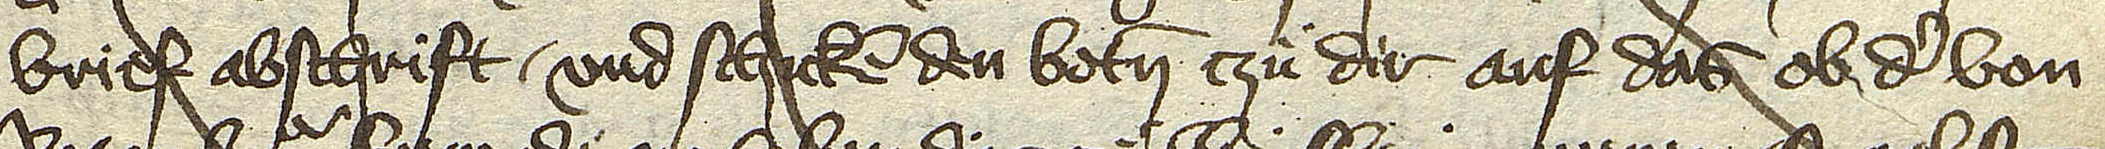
brief abſchrift / vnd ſchicke* den botn* cʒü dir auf das ob d* von
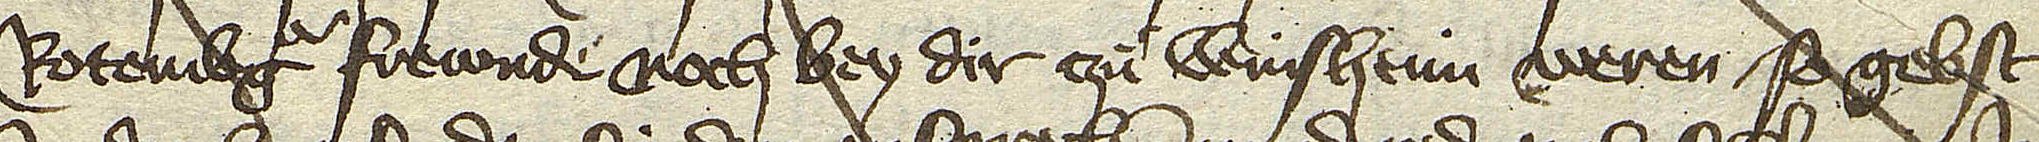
Rotemb*g frewnde noch bey dir cʒü winſheim weren / ſo gebſt
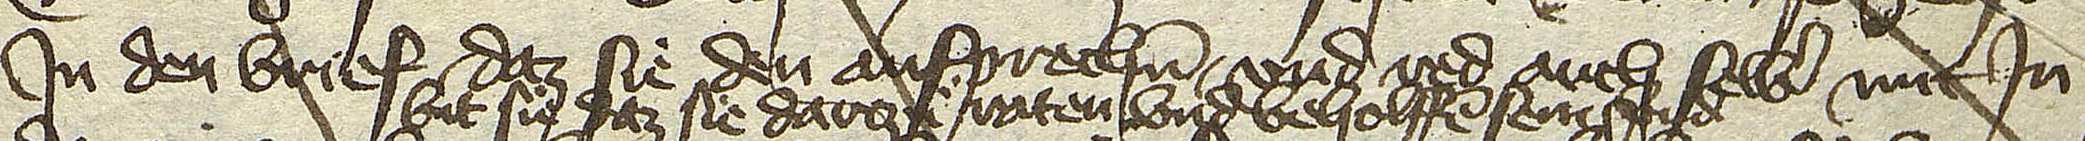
In den brief / daʒ ſie den aufprechn* / vnd red auch ſelb* mit In
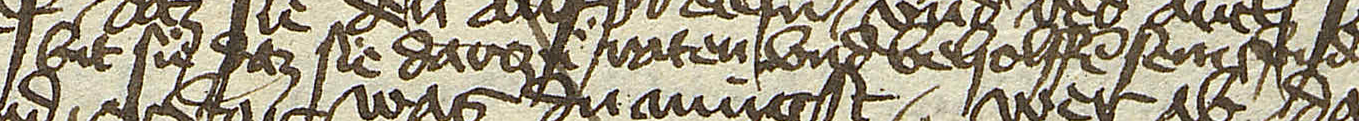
bit ſie daʒ ſie darcʒü raten vnd beholffe* ſein vnd
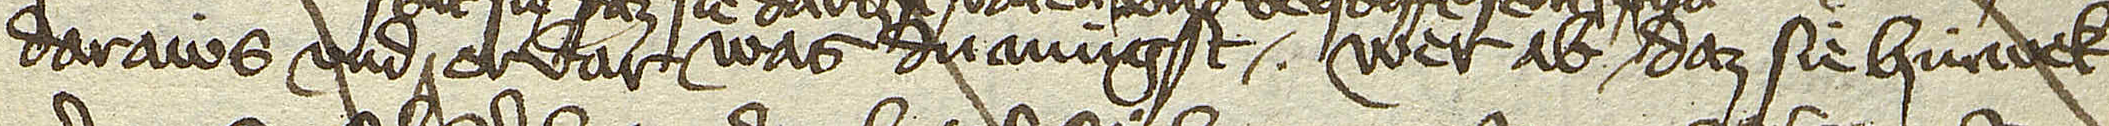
daraus vnd ervar was du mügſt / . wer ab / daʒ ſie hinwek
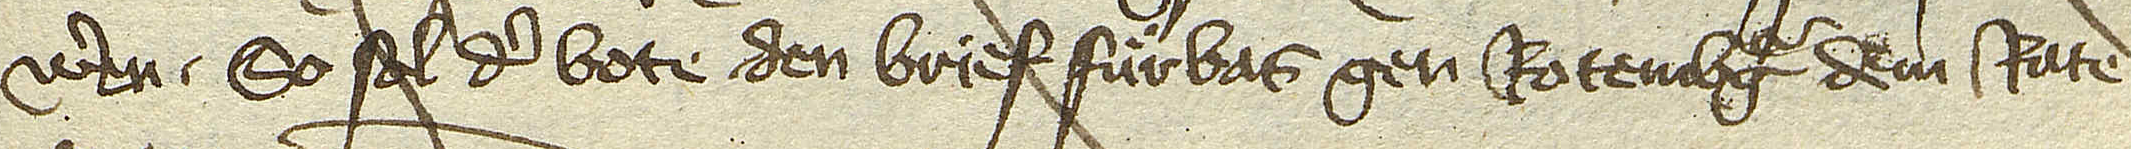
w*en / So ſol d* bote / den brief fürbas gen Rotemb*g dem Rate
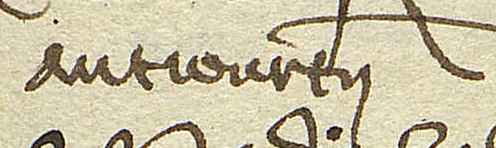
antwurtn*
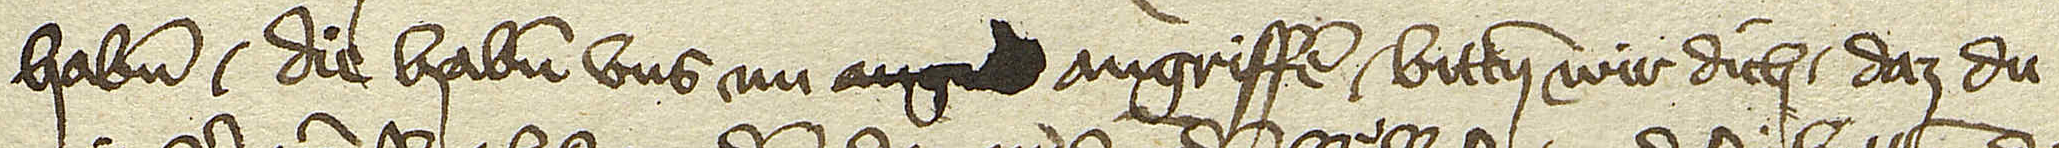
habn* / die habn* vns nu ang angriffe* / bittn* wir dich / daʒ du
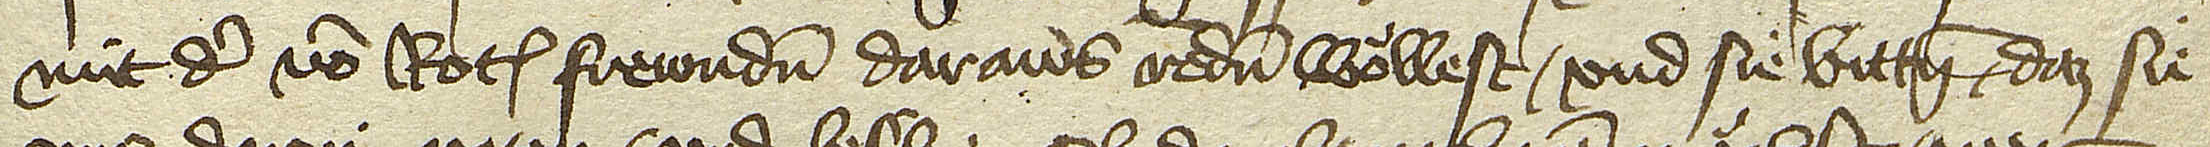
mit d* vo* Rot* frewndn* daraus redn* wölleſt / vnd ſie bittn* / daʒ ſie
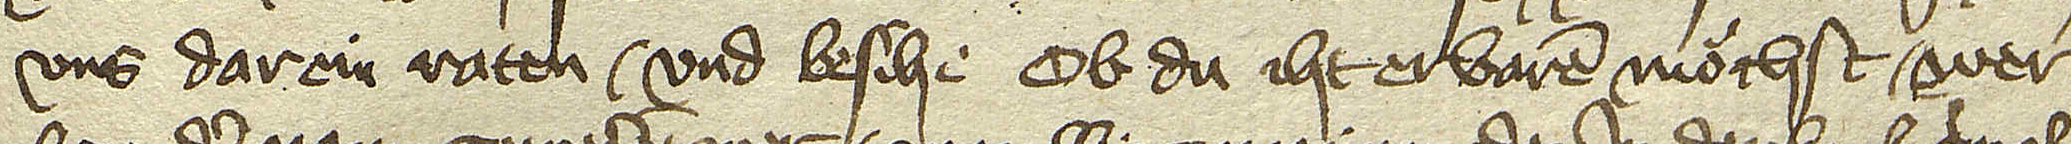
vns darein raten / vnd beſihe Ob du iht ervare* möchſt / wer
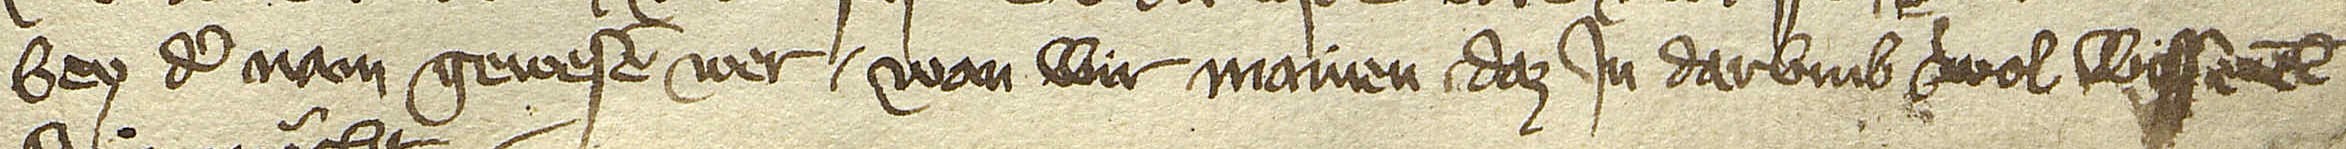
bey d* nam geweſe* wer / wan wir mainen / daʒ In darvmb wol wiſſentl*
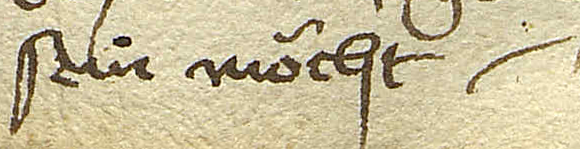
ſein möcht /
